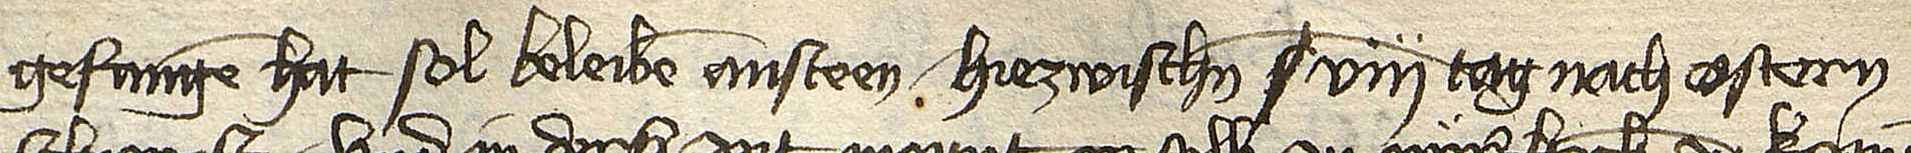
gefange* hat ſol beleibe* anſteen / hieʒwiſchn* ſ* viii tag nach Oſtern
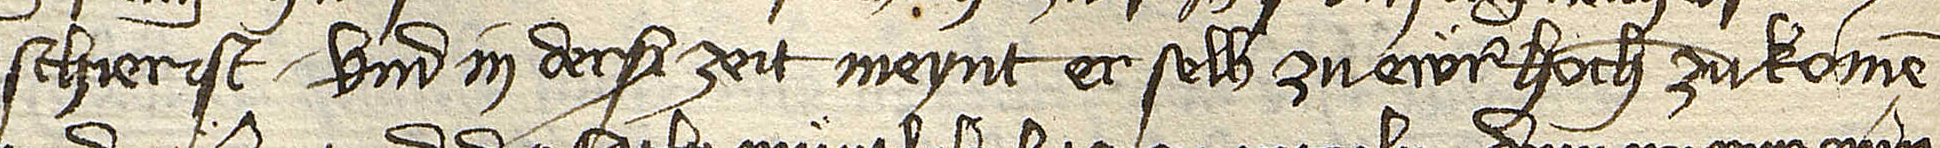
ſchieriſt / Vnd in derſ* ʒeit meynt er ſelb ʒu eẅr* hoch* ʒu kome*
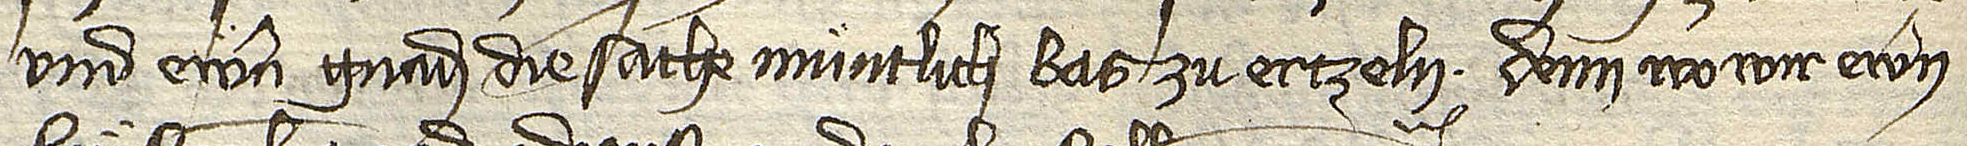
vnd eẅ*n gnad* die ſache müntlich bas ʒu ercʒeln . Denn wo wir ew*n
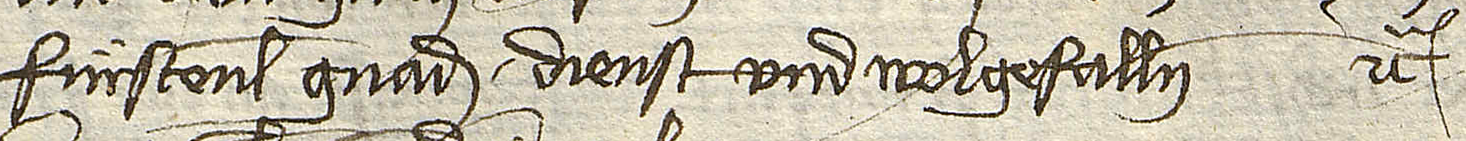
fürſtenl* gnad* / dienſt vnd wolgefalln* ec*
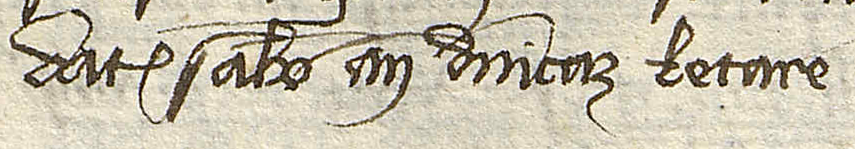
Dat* ſabo* an* dni*ca* letare
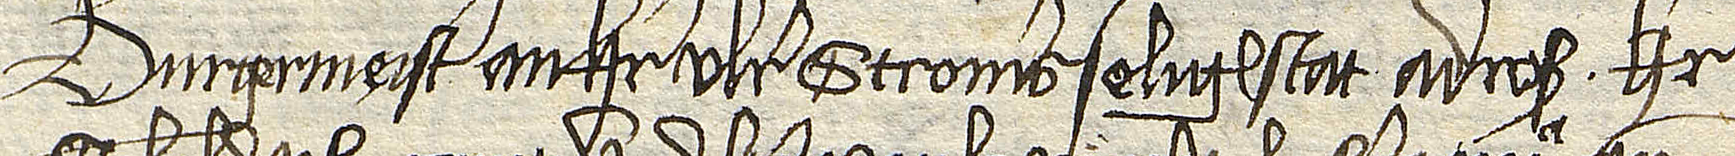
Burgermeiſt* an hr* vlr* Strom*s ſelig* ſtat adroſ* Hr*
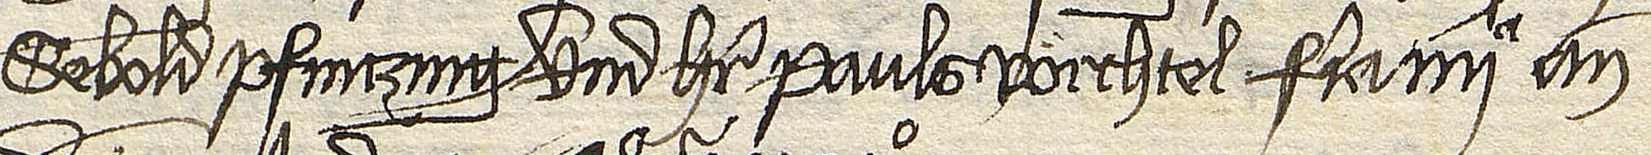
Sebold pfincʒing Vnd hr* Pauls vörchtel fi*a iiii* an*
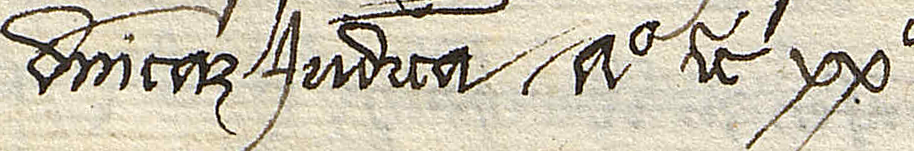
dni*ca* Iudica / A* ec* xx*
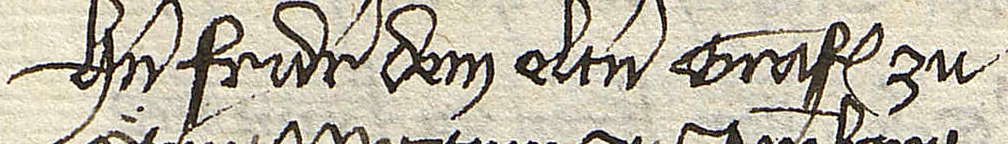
hn* fridr* dem eltn* Graf* ʒu
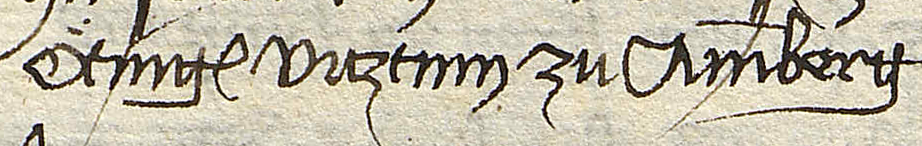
Öting* Vicʒtum ʒu Am*berg
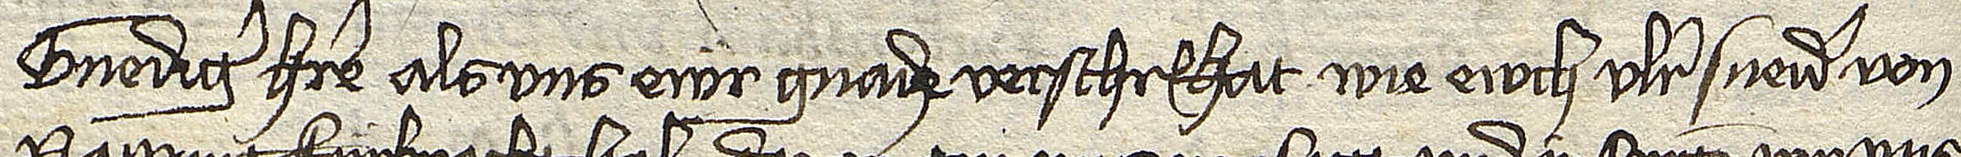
Gnedig* h*re als vns eẅr gnade verſchr* hat wie ewch vlr* ſneid* von
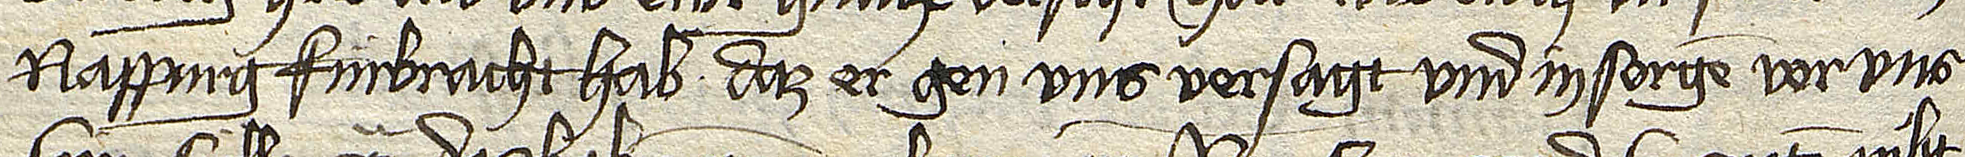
Nappurg fürbracht hab . daʒ er gen vns verſagt vnd in ſorge* vor vns
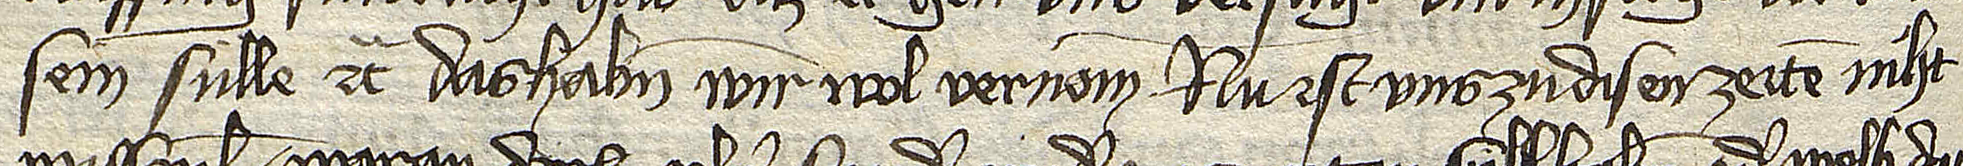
ſein ſülle ec* das habn* wir wol vernom* Nu iſt vns ʒu diſen ʒeite* niht
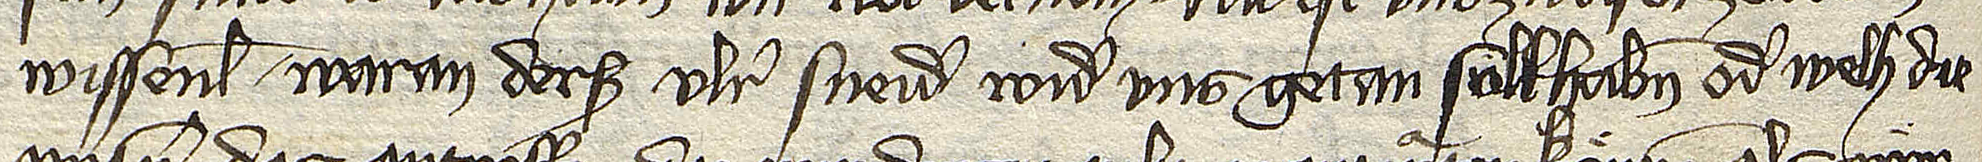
wiſſenl* / waran derſ* vlr* ſneid* wid* vns getan ſoll habn* od* welh die
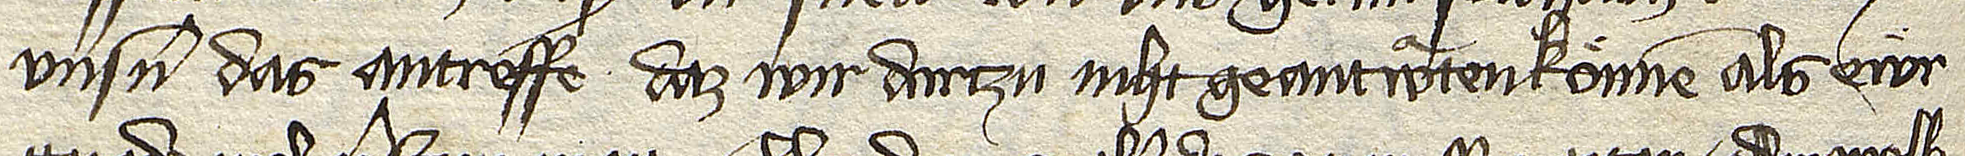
vnſn* das antreffe . daʒ wir darcʒu niht geantw*ten könne* als eẅr
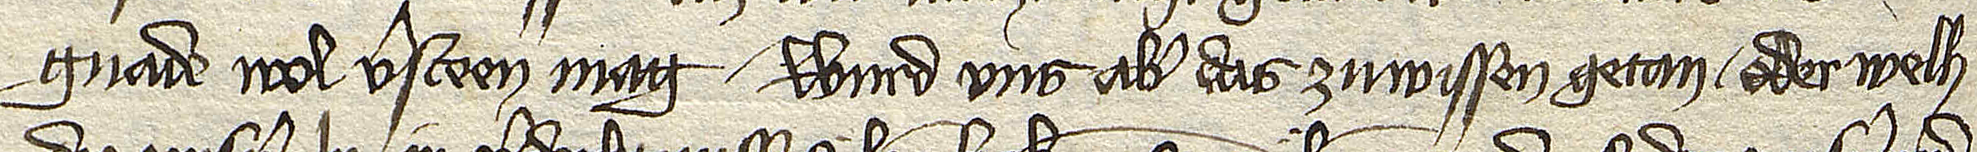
gnade wol v*ſteen mag / Wurd vns ab* das ʒu wiſſen getan / oder welh
